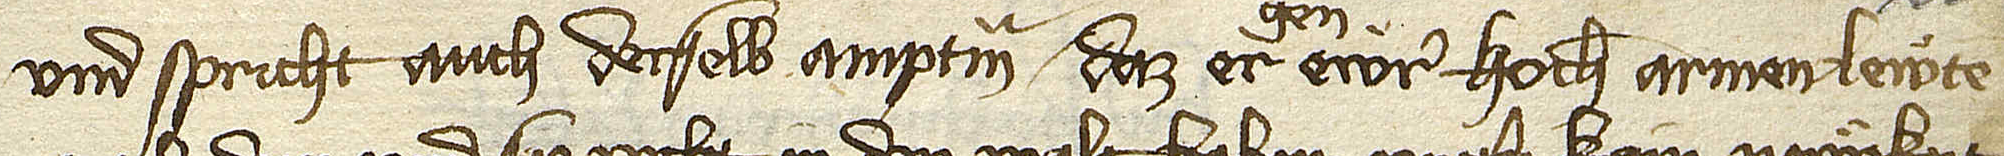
vnd ſpricht auch derſelb* amptm* / daʒ er ew*r hoch* armen lewte
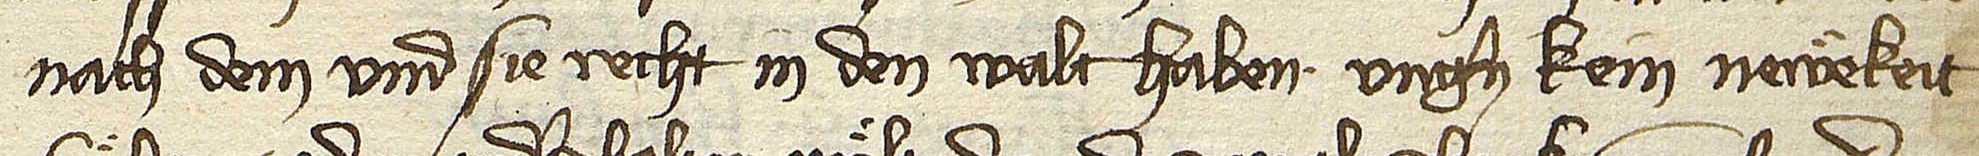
nach dem vnd ſie recht in den walt haben . vng*n kein newekeit
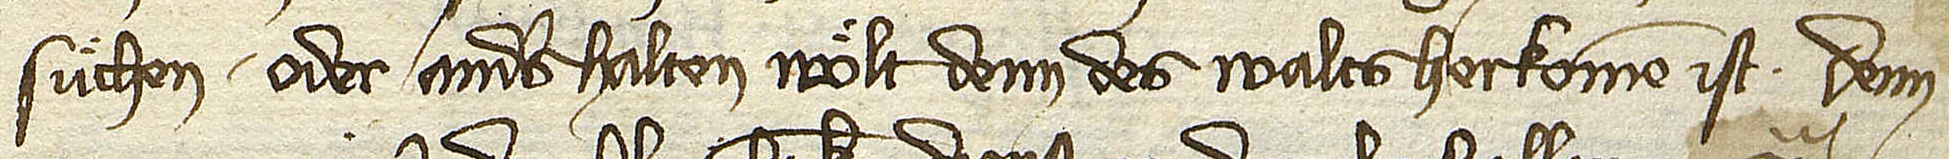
ſüchen / oder and*s halten wölt denn des walts herkome* iſt . Denn
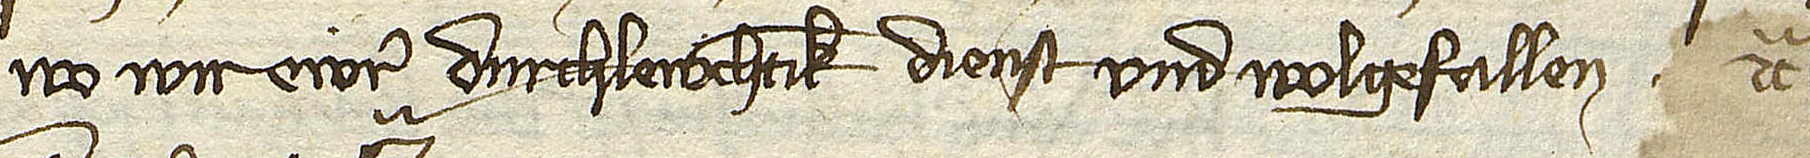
wo wir ew*r durchlewchtik* dienſt vnd wolgefallen . ec*
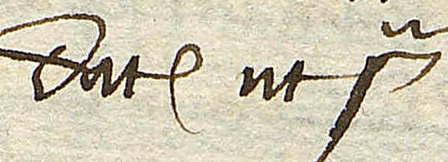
Dat* ut ſ*
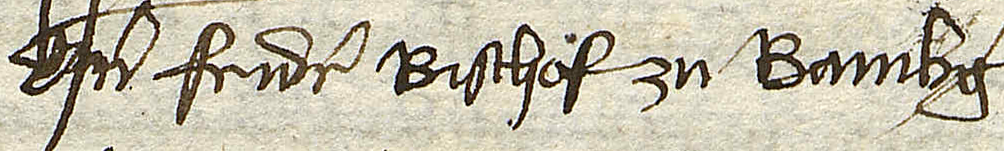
H*n fridr* Biſchof ʒu Bamb*g
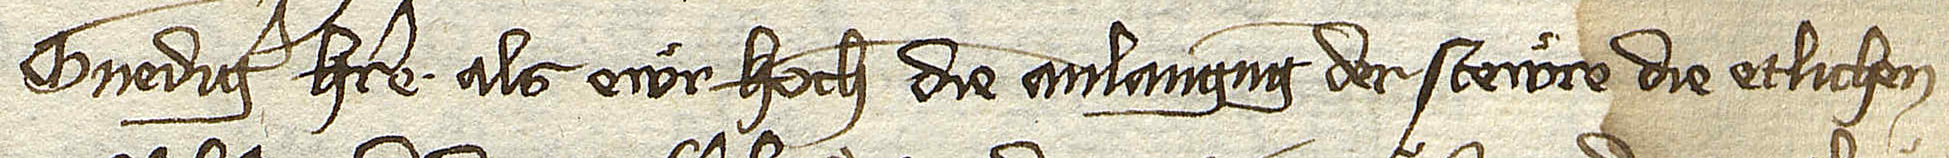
Gnedig* h*re . als ewr hoch* die anlangu*g der ſtewre die etlichen
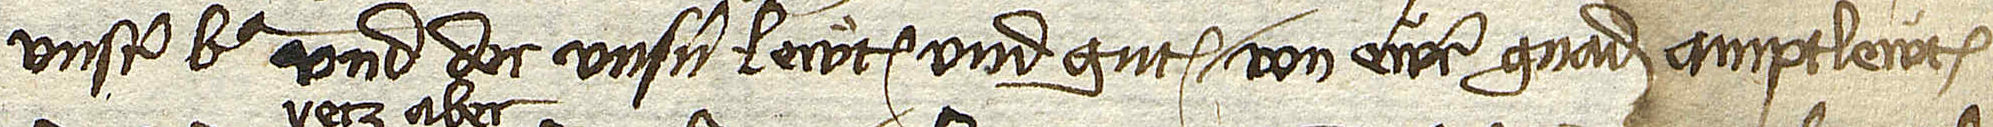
vnſ*r b* vnd der vnſ*n lewt* vnd gut* / von ew*r gnad* amptlewt*
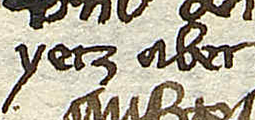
yecʒ aber
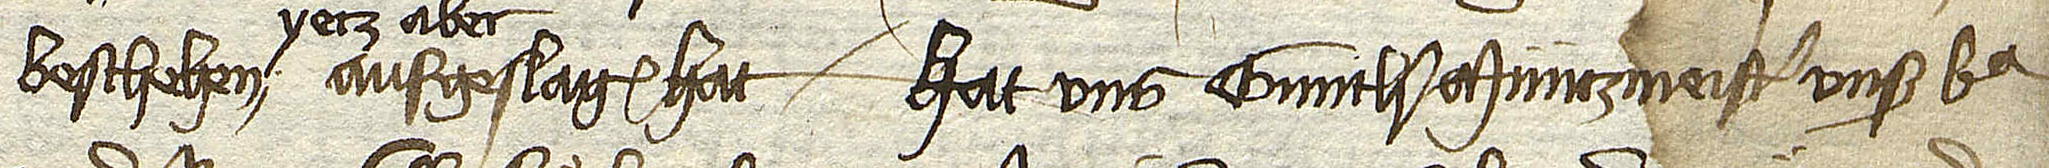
beſchehen / aufgeſlag* hat / Hat vns Gunth* Müncʒmeiſt* vnſ* b*
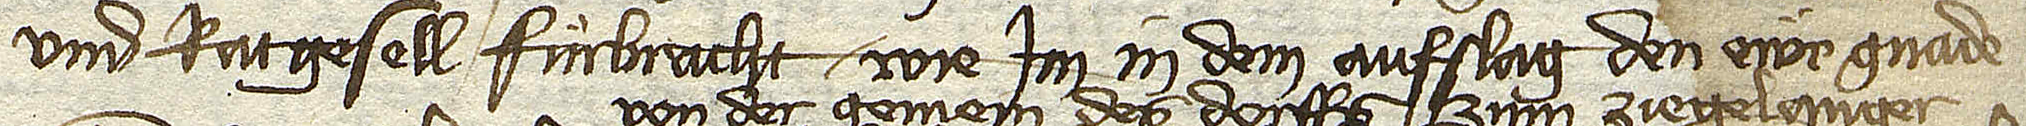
vnd Ratgeſell fürbracht / wie Im in den aufſlag den ewr gnade
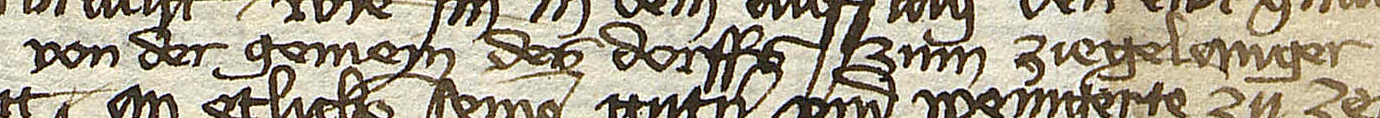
von der gemein des dorffs ʒum ʒiegelanger
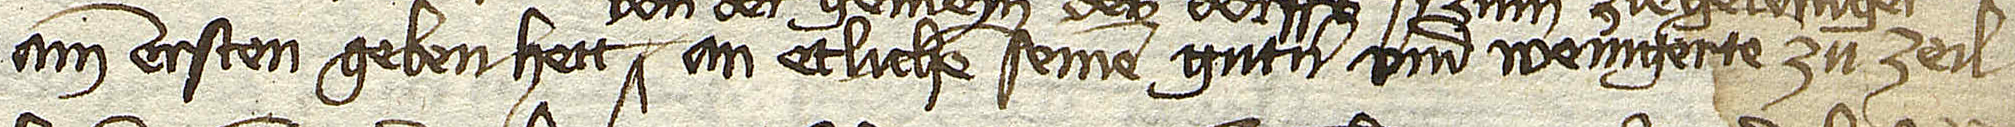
am* erſten geben hett an etliche* ſeine* güt*n vnd weingerte ʒu ʒeil
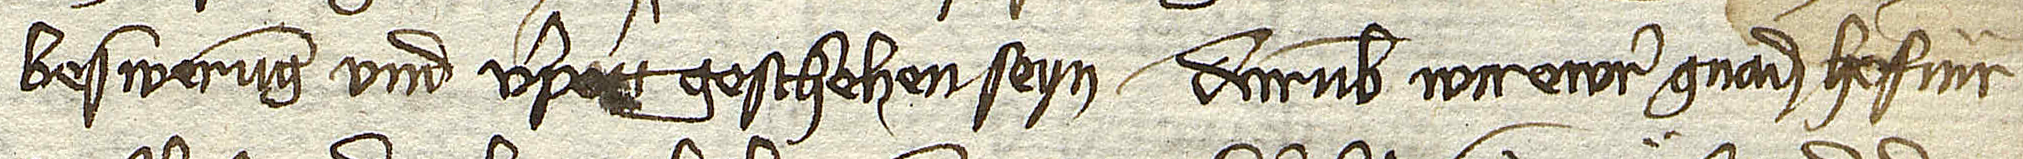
beſweru*g vnd v*pott geſchehen ſeyn / Daru*b wir ew*r gnad* hofm*r
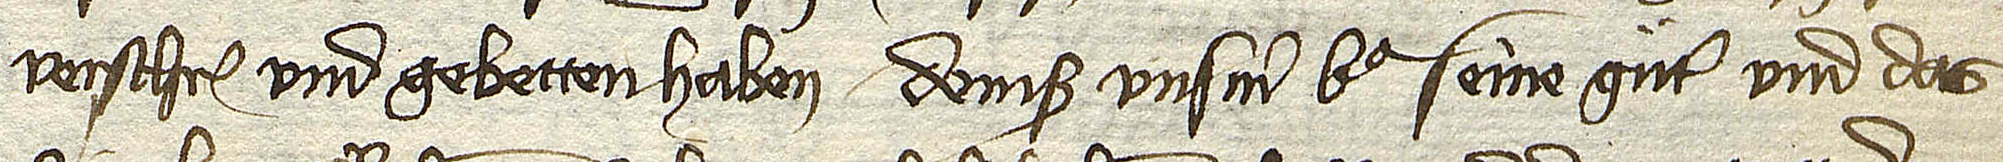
verſchr* vnd gebetten haben / demſ* vnſ*m b* ſeine güt* vnd das
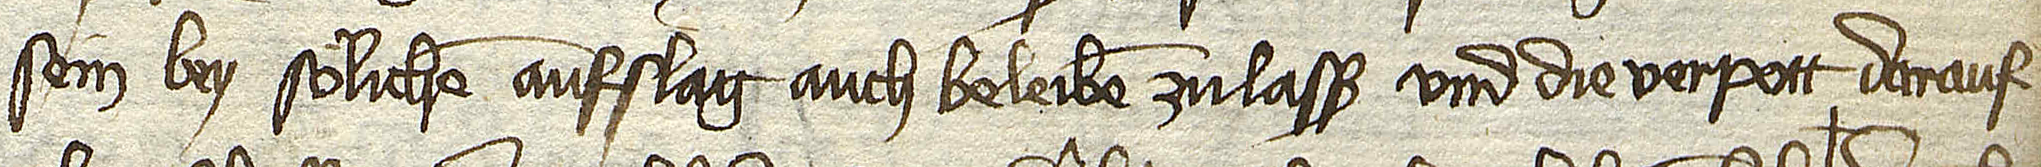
ſein bey ſöliche* aufſlag auch beleibe* ʒu laſſ* vnd die verpott darauf
